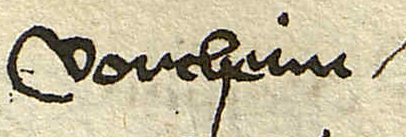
Vorcheim /
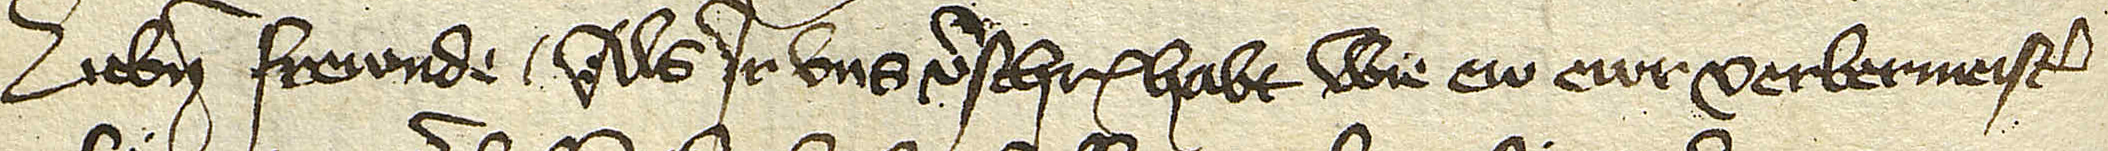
Liebn* frewnde / Als Ir vns v*ſchr* habt wie ew ewr verbermeiſt*
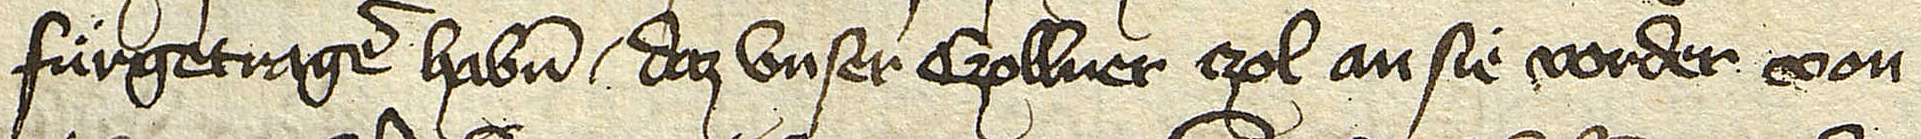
fürgetrage* habn* / daʒ vnſer Cʒollner cʒol an ſie vorder von
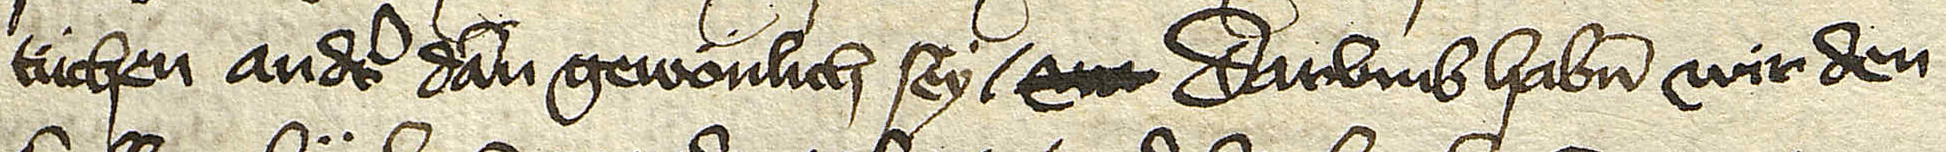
tüchen ands* da*n gewönlich ſey / wo Darvmb habn* wir den
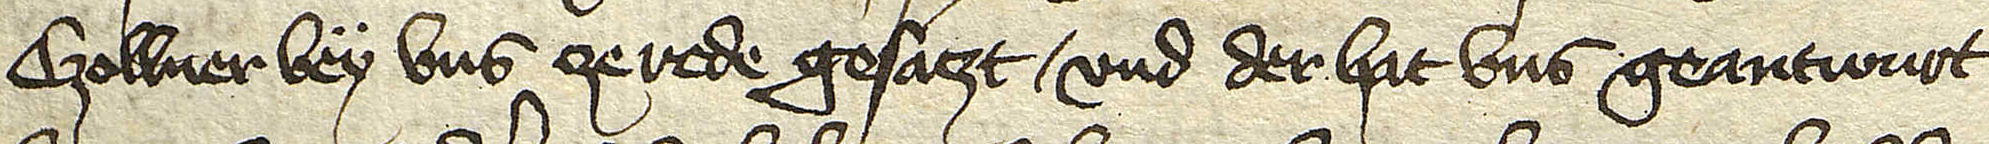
Cʒollner bey vns cʒe rede geſacʒt / vnd der hat vns geantwurt
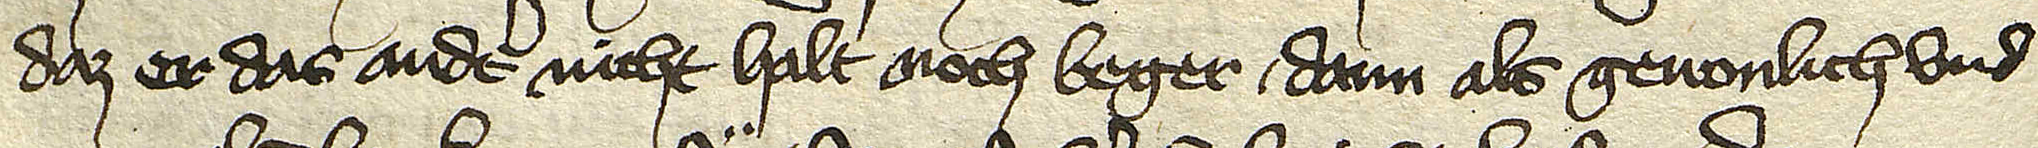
daʒ er das ands* nicht halt noch beger / dann als gewonlich vnd
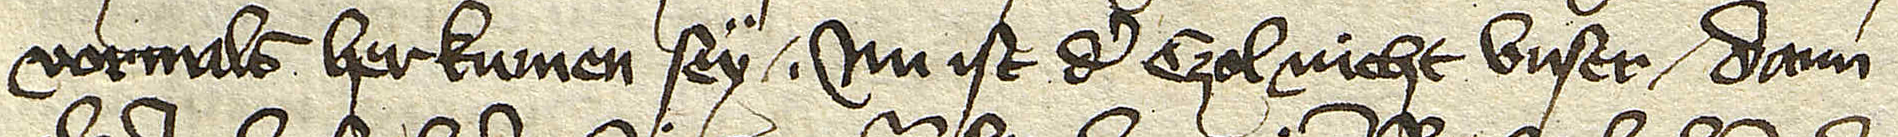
vormals herkumen ſey / . Nu iſt d* Cʒol nicht vnſer / dann
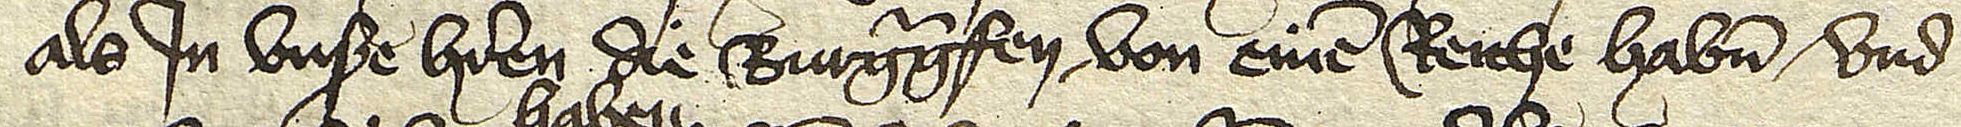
als In vnſ*e hr*en die Burgg*fen / von eine* Reiche habn* / vnd
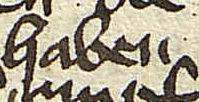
haben
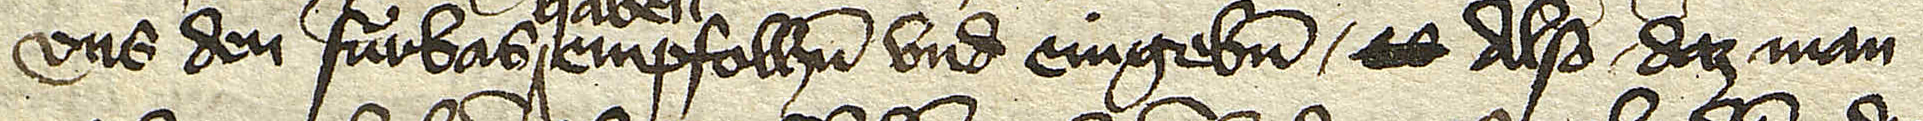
vns den fürbas empfolhn* vnd eingebn* / es Alſo / daʒ man
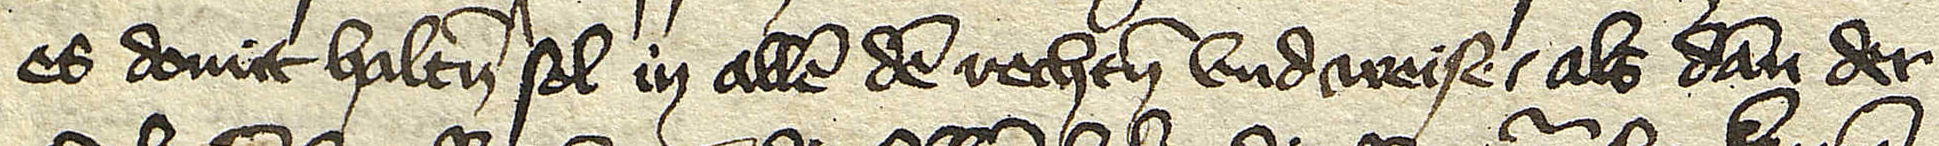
es domit haltn* ſol in alle* de* rechtn* vnd weiſe / als dan* der
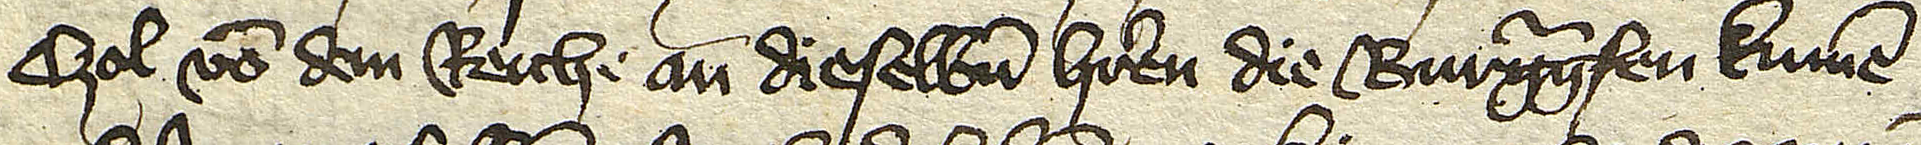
Cʒol vo* dem Reiche an* dieſelbn* hr*en die Burgg*fen kume*
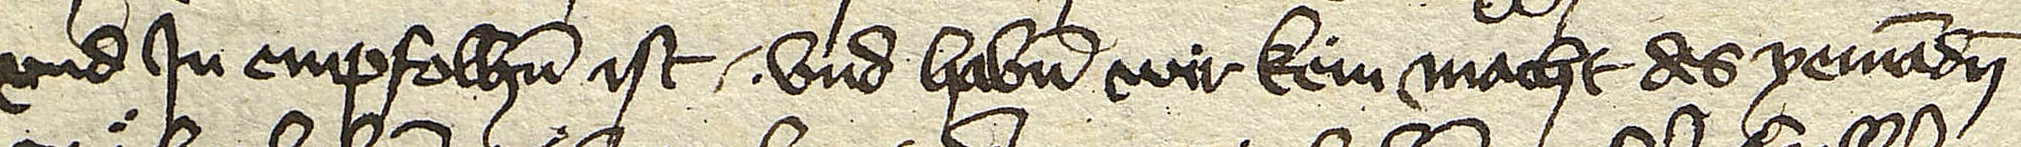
vnd In empfolhn* iſt / . vnd habn* wir kein macht des yema*dn*
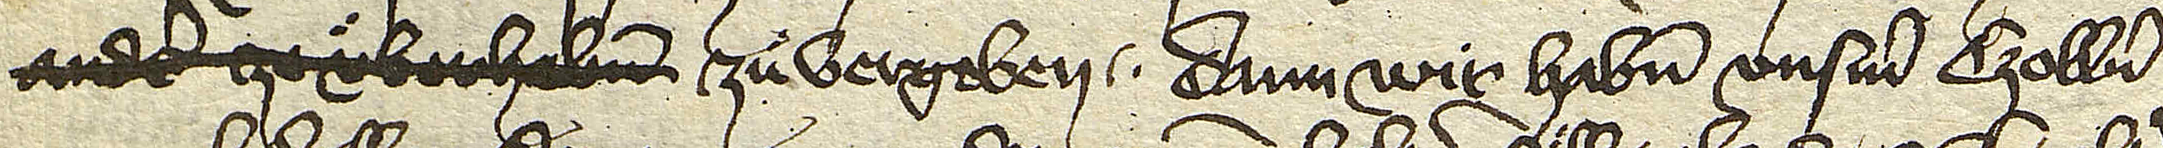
ands* cʒe v̈berhabn* cʒü vergeben / . Dann wir habn* vnſm* Cʒolln*
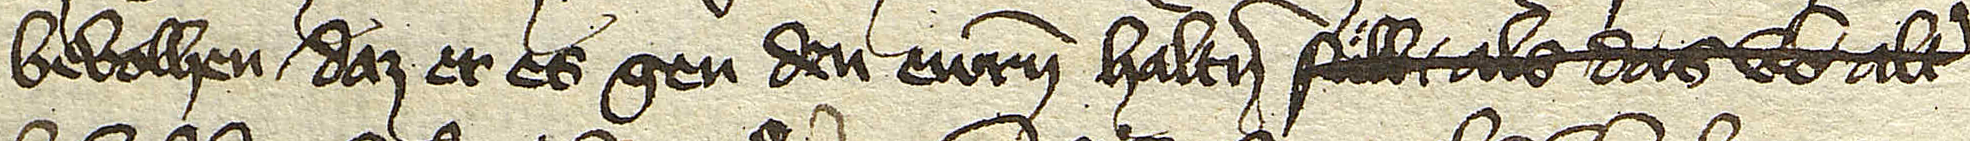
bevolhen / dʒ er es gen den ewrn* haltn* ſüll / als das vo* alt*
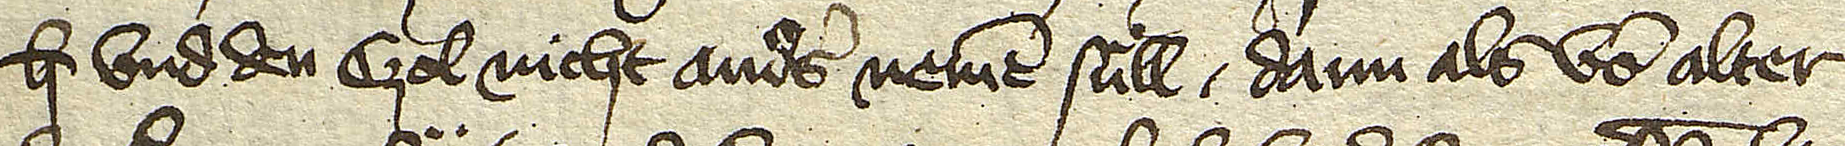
h vnd den Cʒol nicht ands* neme* ſüll / dann als vo* alter
